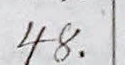48.
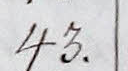43.
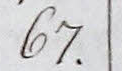67.
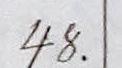48.
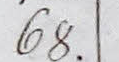68.
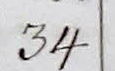34
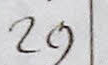29
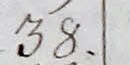38.
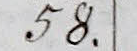58.
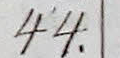44.
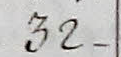32
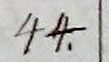44.
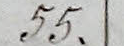55.
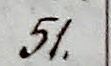51.
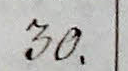30.
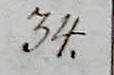34.
